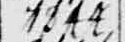7344
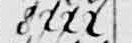8222
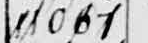11067
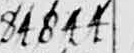4844
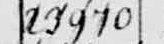23970
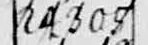24305
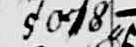5078
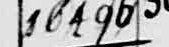16496
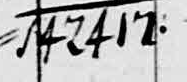142417
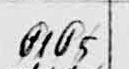6165
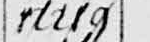12219
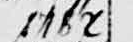1782
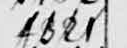4321
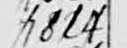7824
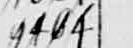9464
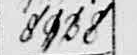8938
